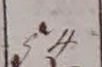54
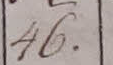46.
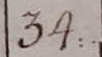34
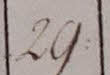29
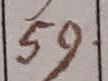59
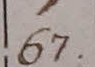67
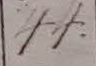44
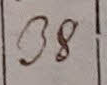38
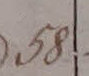58
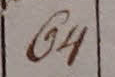64
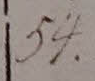54
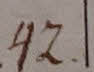42
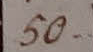50
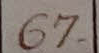67
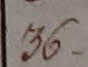36
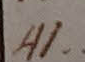41
